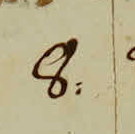8:
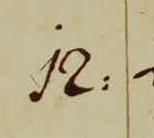12:
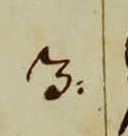3:
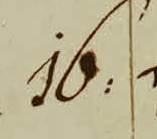16:
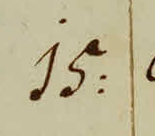15:
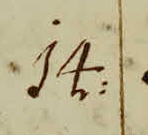14:
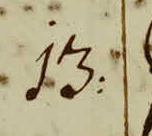13:
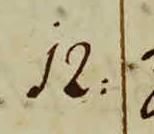12:
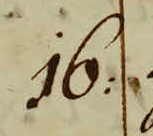16:
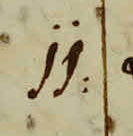11:
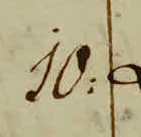10:
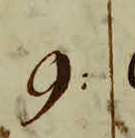9:
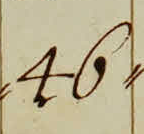46
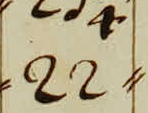22
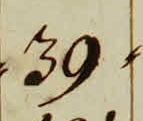39
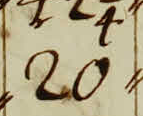20
